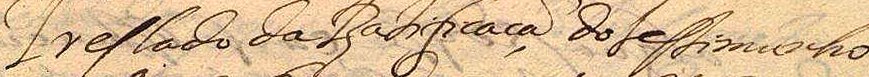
Treslado da Ratificação do testimunho
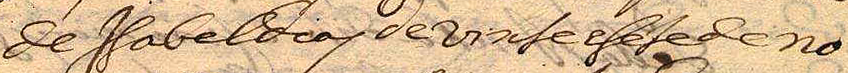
de Jsabel dias de vinte e sete de no
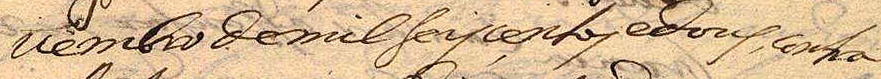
uembro de mil seisçentos e dous, contra
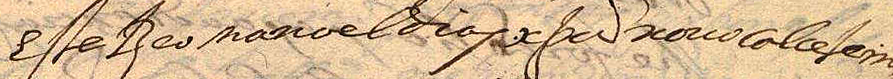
Este Reo manoel dias xpão nouo calceteiro
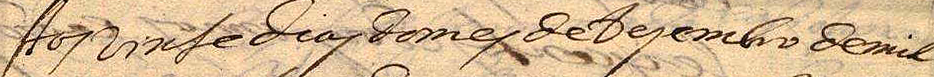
Aos vinte dias do mes de Dezembro de mil
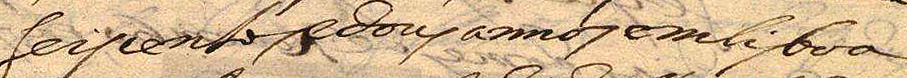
seiscentos e dous annos em lisboa
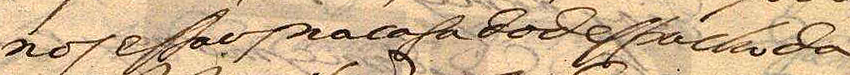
nos Estaos na casa do despacho da
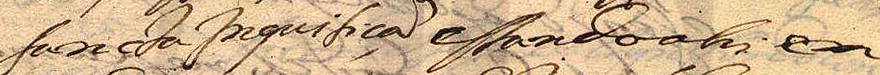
sancta Jnquisição estando ahi em
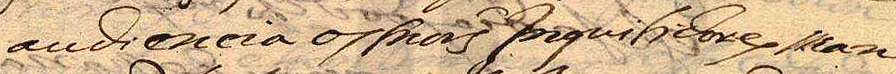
audiençia os snors̄ Jnquisidores man
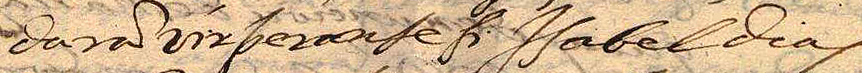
daraõ vir perante si Jsabel dias
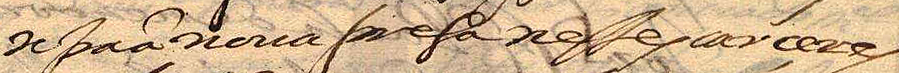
xpaā noua presa nestes carçeres
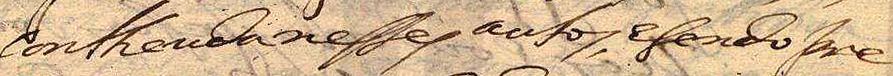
contheuda nestes autos, E sendo pre
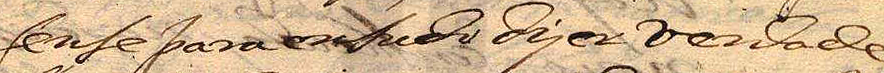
sente para en tudo dizer verdade
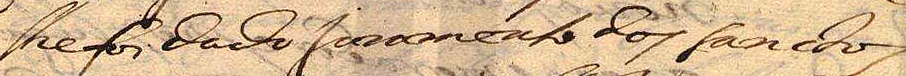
lhe foi dado Juramento dos sanctos
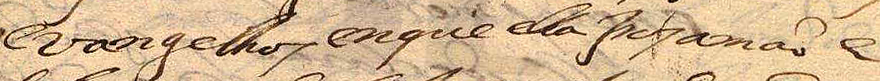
evangelhos en que ella pos a maõ E
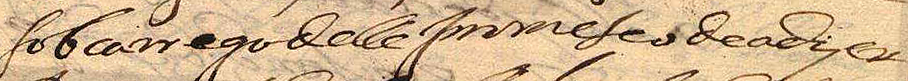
sob carrego delle prometeo de a dizer
